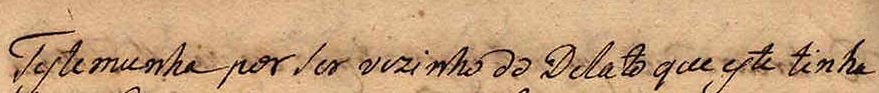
Testemunha por ser vezinho do Delato que este tinha
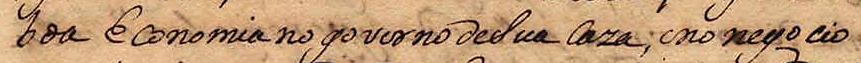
boa Economia no governo de Sua caza, e no negocio
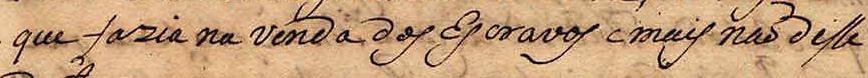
que fazia na venda dos Escravos e mais naõ disse
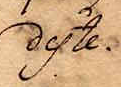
deste.
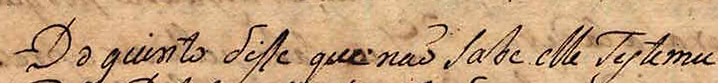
Do quinto disse que naõ sabe elle Testemu
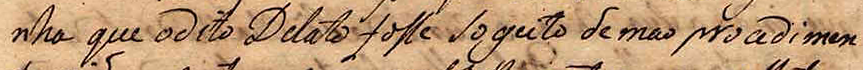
nha que o dito Delato fosse sogeito de mao procedimen
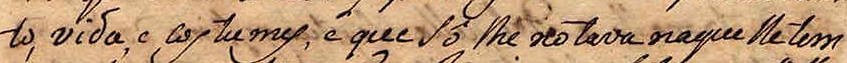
to, vida, e costumes, e que só lhe notava naquelle tem
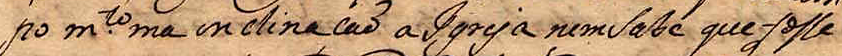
po m.to ma inclinaçaõ a Igreja nem sabe que fosse
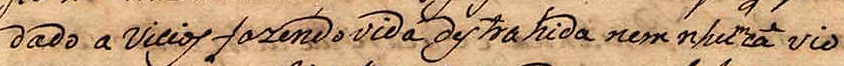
dado a vicios fazendo vida destrahida nem nhumca vio
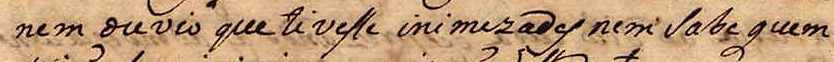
nem ouvio que tivesse inimizades nem sabe quem
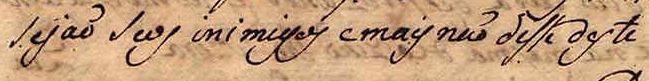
sejaõ seos inimigos e mais naõ disse deste
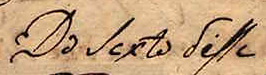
Do sexto disse
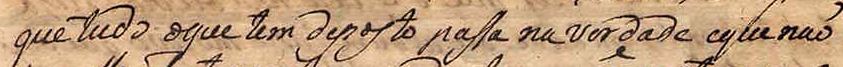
que tudo o que tem deposto passa na verdade e que naõ
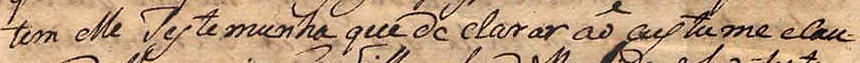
tem elle Testemunha que declarar ao custume e cau
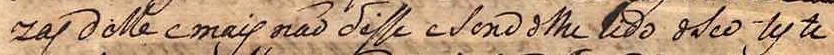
zas delle e mais naõ disse e sendolhe lido o seo teste
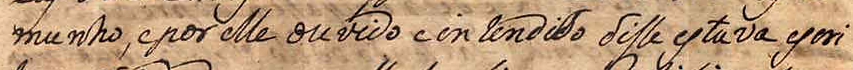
munho, e por elle ouvido, e entendido disse estava escri
